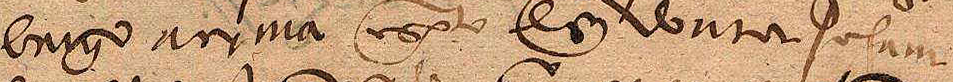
bargo acyma esp̄to do s̄r doutor Joham
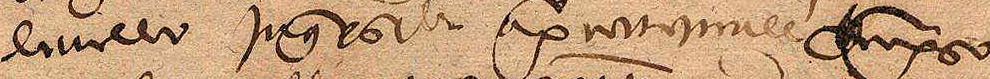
de mello Jnq̄sydor a p̄o corte rreall Reo p̄so
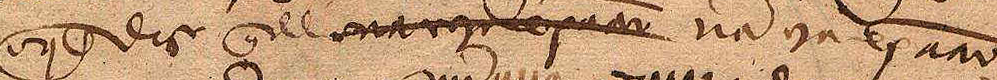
o q̄ll dise q̄ elle nacera xpaão nā era xpaão
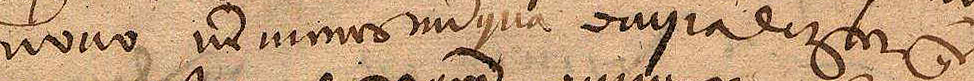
nouo nē menos nūqua ouujra dizer q̄ ē
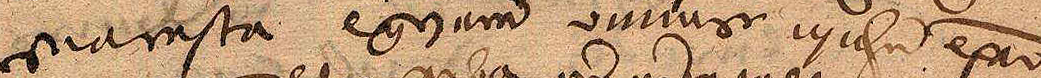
sua casta e geracā ouuese njnhū xpão
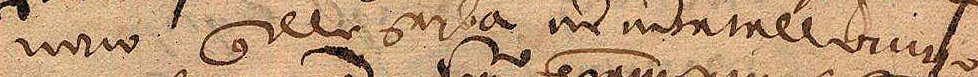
nouo q̄ elle sayba nē nūca tall ouujo
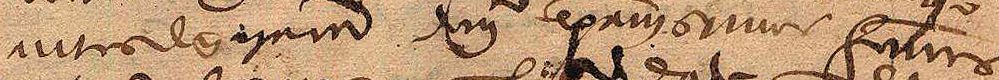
antes de geracā de mto x̄panjsymos hom̄es
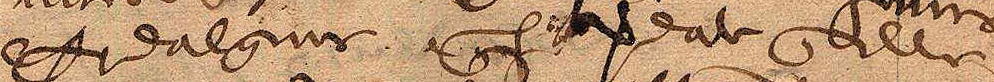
e fydalguos e q̄ he ꝟdade q̄ elle
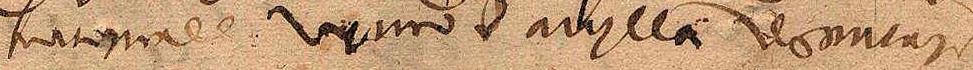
corte rreall vyueo ē a ujlla de samtarē
